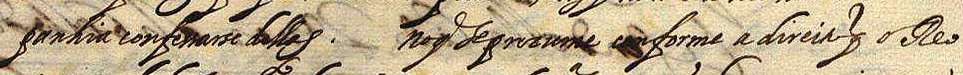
panhia confessarse dellas. no q̄ se prezume conforme a direito q̄ o Reo
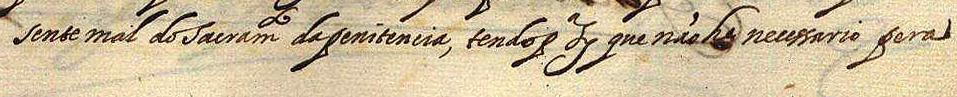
sente mal do Sacramto da penitencia, tendo p.a sy que não he necessario pera
